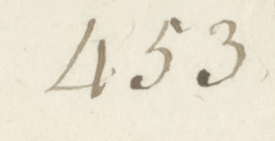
453
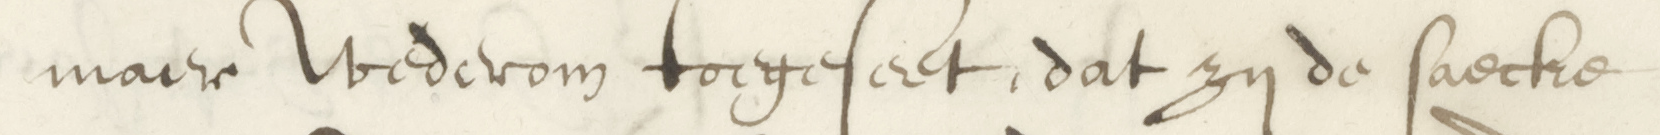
maer wederom toegeseet, dat zy de saecke
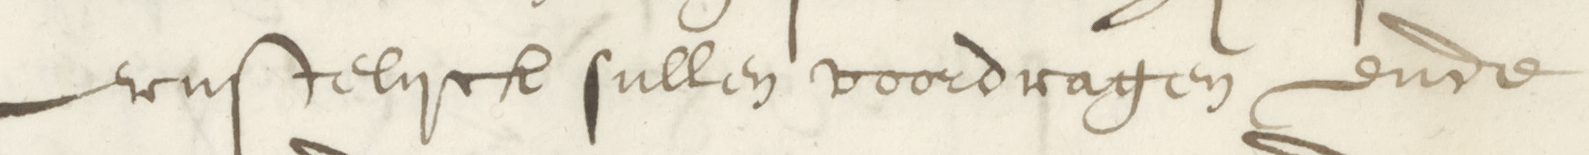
ernstelyck sullen voordragen ende
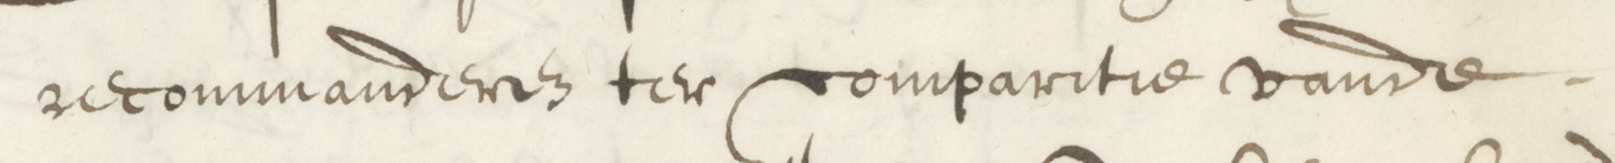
recommanderen ter comparitie vande
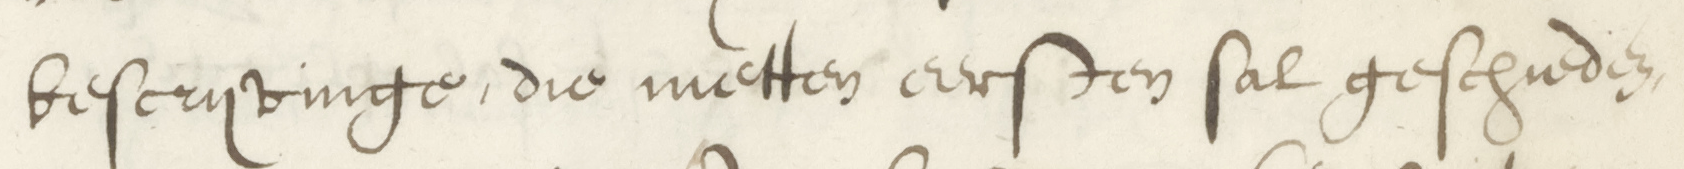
bescryvinge, die metten eersten sal geschieden,
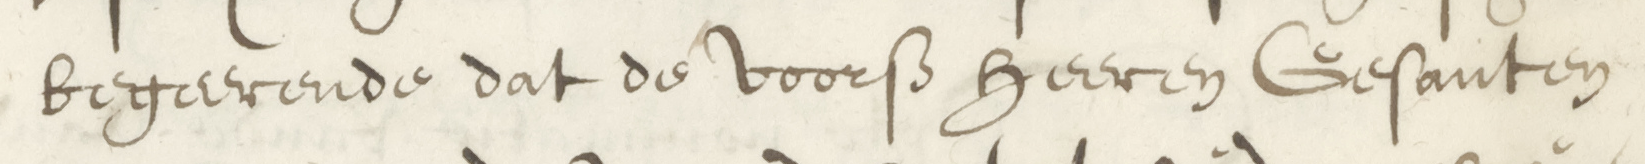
begeerdende dat de voors heeren Gesanten
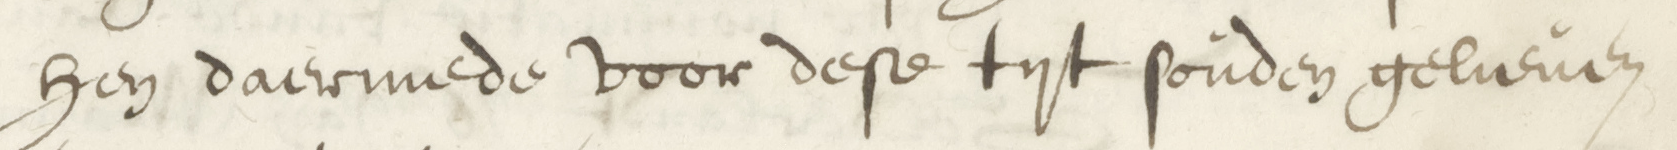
hen daermede voor dese tyt souden gelieuen
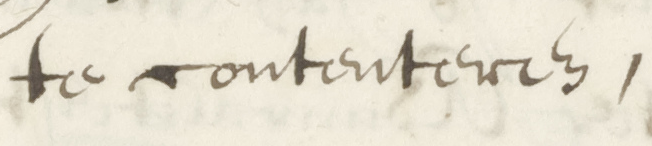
te contenteren.
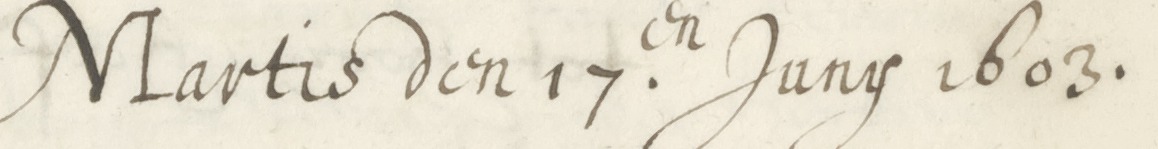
Martis den 17en. Juny 1603.
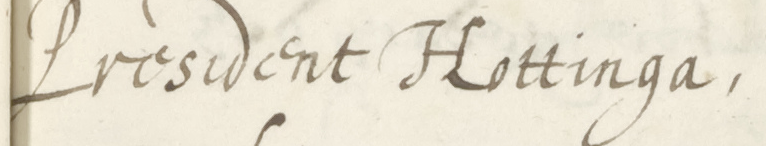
President Hottinga,
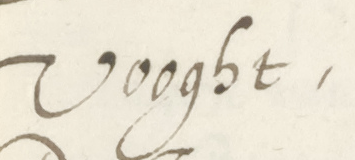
Vooght,
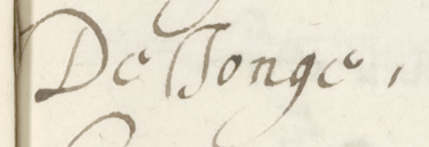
De Jonge,
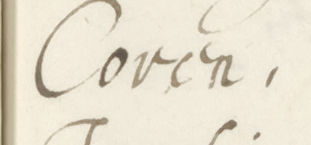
Coren,
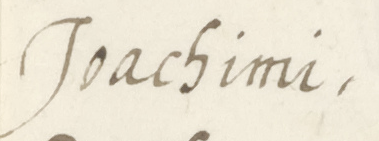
Joachimi,
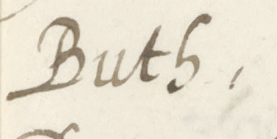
Buth,
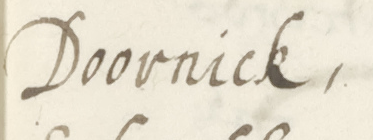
Doornick,
